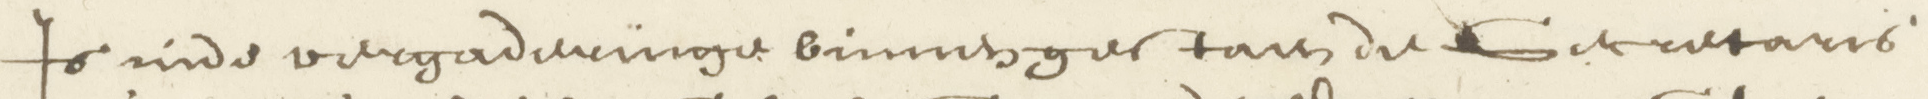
Is inde vergaderinge binnen gestaen de Secretaris
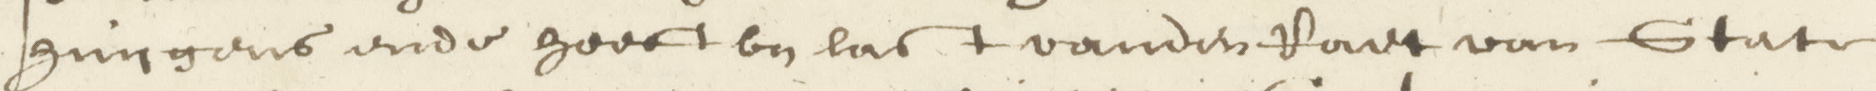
Huygens ende heeft by last vanden Raet van State
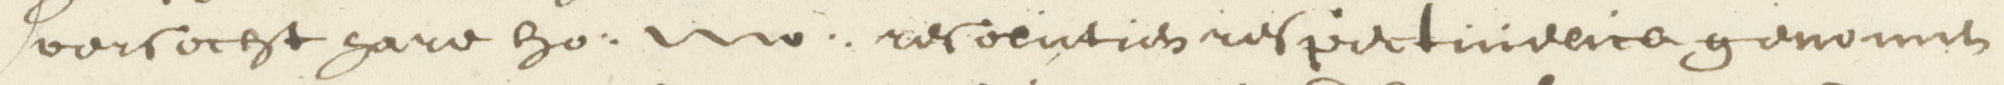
versocht hare Ho:Mo: resolutien respectiuelick genomen
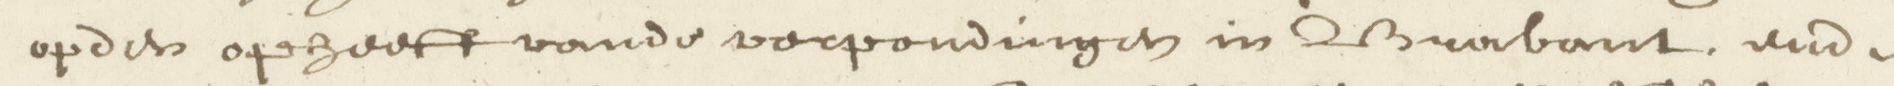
op den opheeff vande verpondingen in Brabant, ende
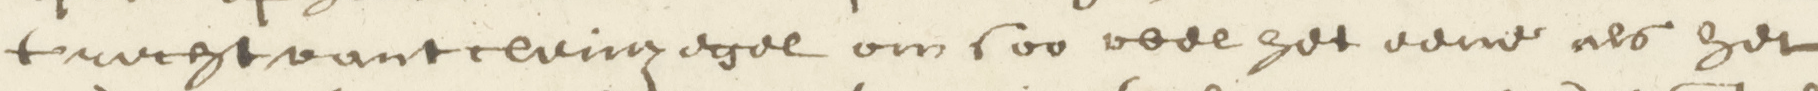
t recht vant cleinzegel om soo wel het eene als het
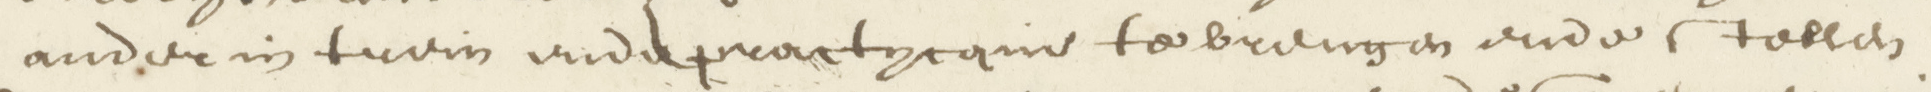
ander in trein ende practyque te brengen ende stellen.
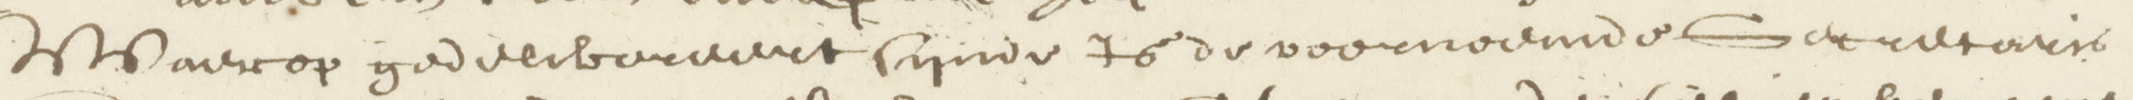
Waerop gedelibereert synde Is de voornoemde Secretaris
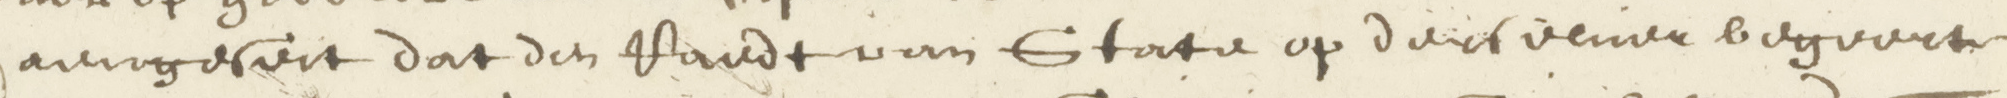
aengeseit dat den Raedt van State op derseluer begeerte
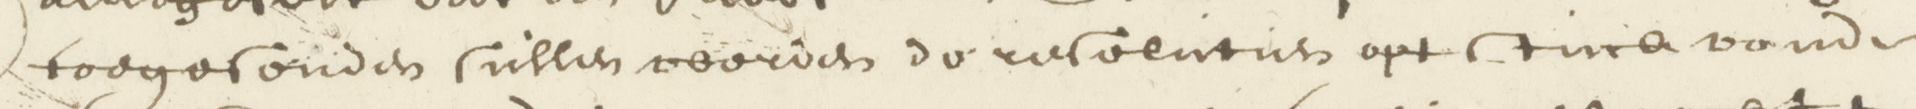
toegesonden sullen worden de resolutien opt stuck vande
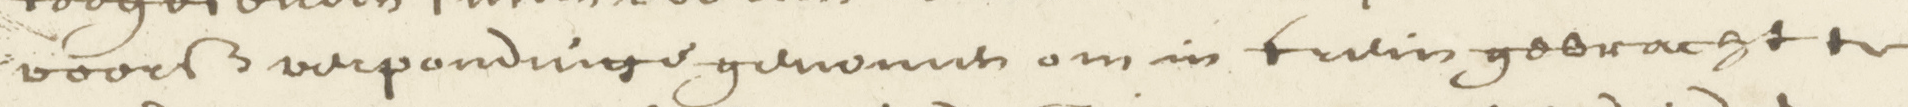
voors verpondinge genomen om in trein gebracht te
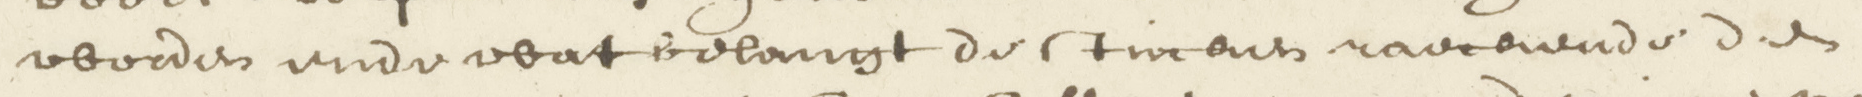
worden ende wat belangt de stucken raeckende den
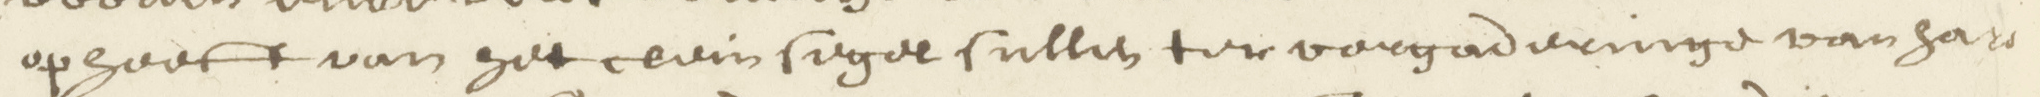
opheeff van het clein segel sullen ter vergaderinge van hare
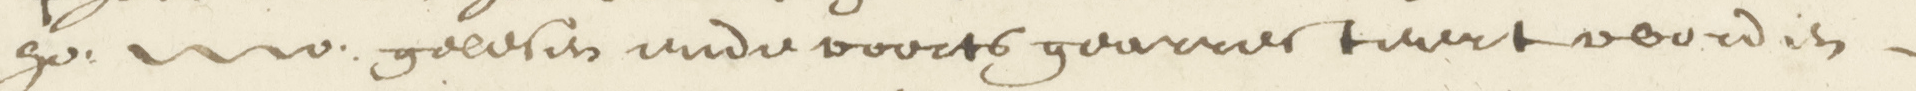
Ho:Mo: gelesen ende voorts gearresteert worden
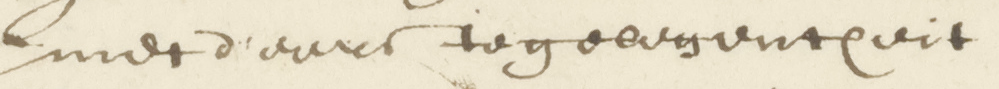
met d‛eerste gelegentheit.
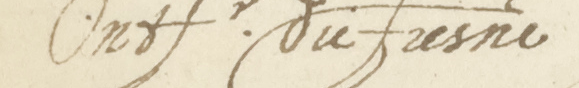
Ontfr. du fresne
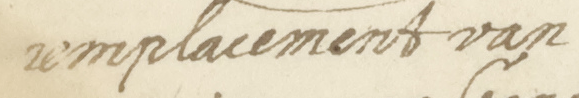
remplacement van
